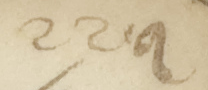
224.
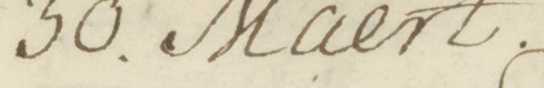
30. Maert.
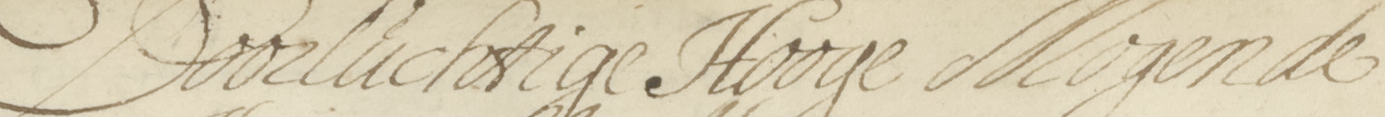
Doorluchtige Hooge Mogende
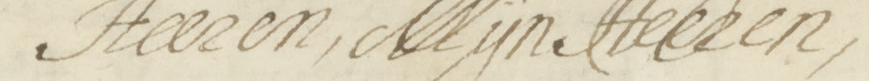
Heeren, Mijn Heeren,
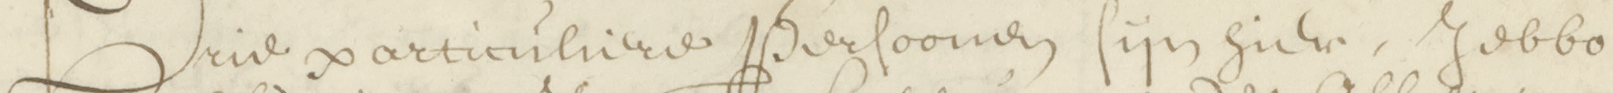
Drie particuliere Persoonen sijn hier, Jebbo
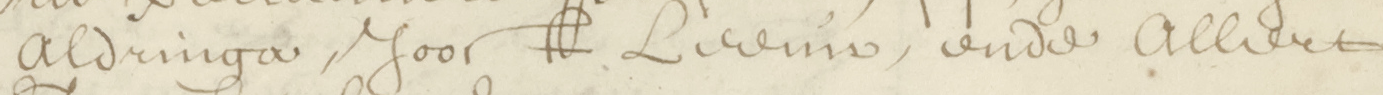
Aldringa, Joost Leeuw, ende Allert
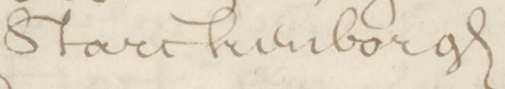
Starckenborgh
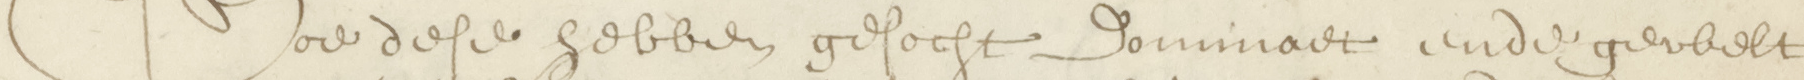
Hoe dese hebben gesocht Dominaet ende gewelt
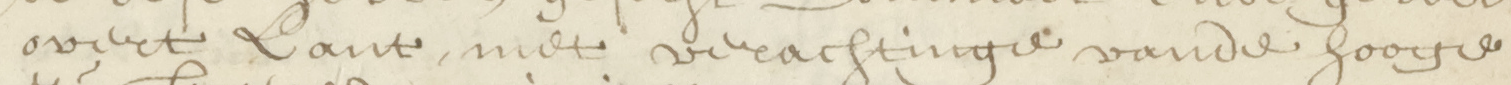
overt Lant, met verachtinge vande hooge
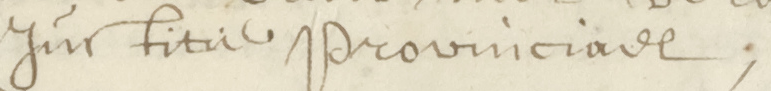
Justitie Provinciael;
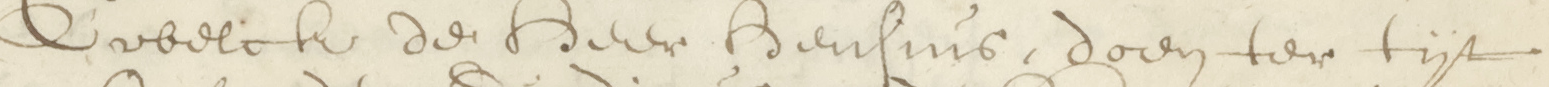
Twelck de Heer Hensius, doen ter tijt
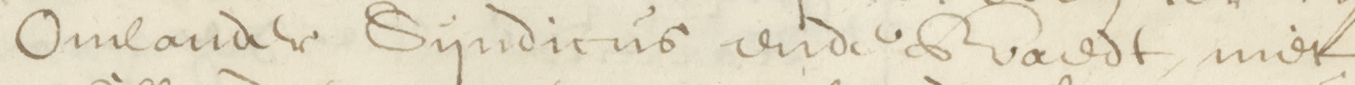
Omlander Sijndicus ende Raedt, niet
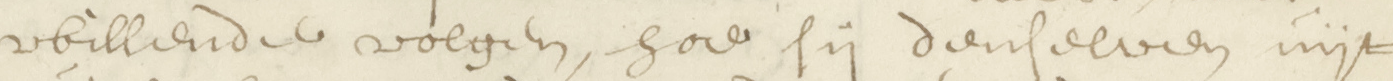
willende volgen, hoe sij denselven uijt
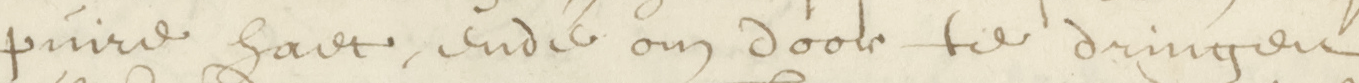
puire haet, ende om door te dringen
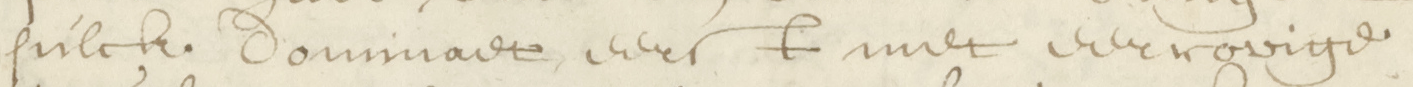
sulck Dominaet, eerst met eerrovige
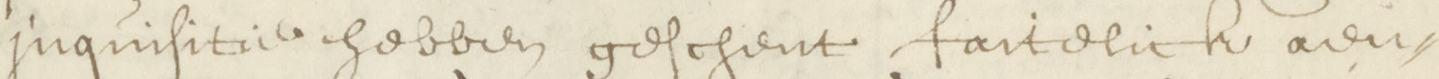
inquisitie hebben geschent, faitelick aen„
